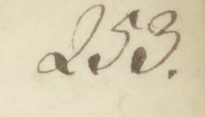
253.
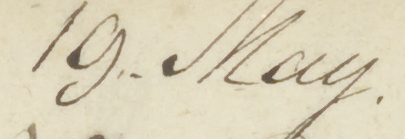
19. May.
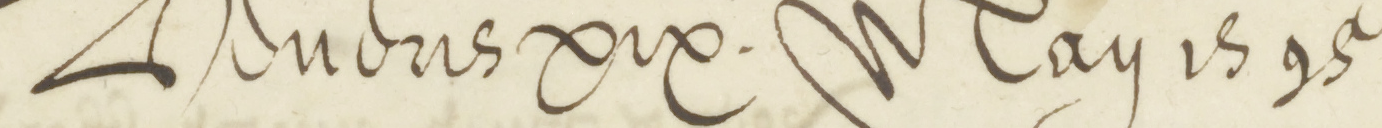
Veneris XIXen May 1595.
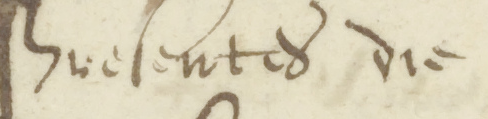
Presentes die
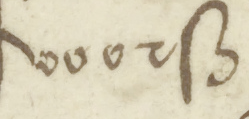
voors
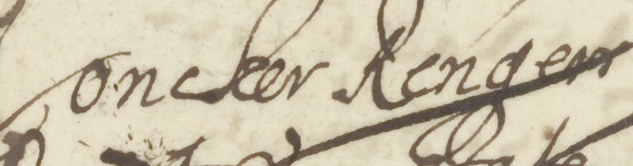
Joncker Rengers
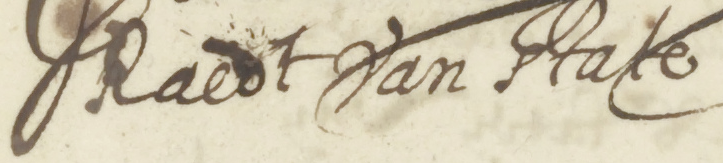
Raedt van State
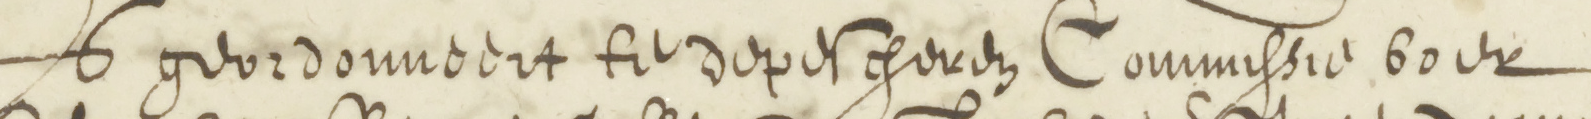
Is geordonneert te depescheren Commissie voer
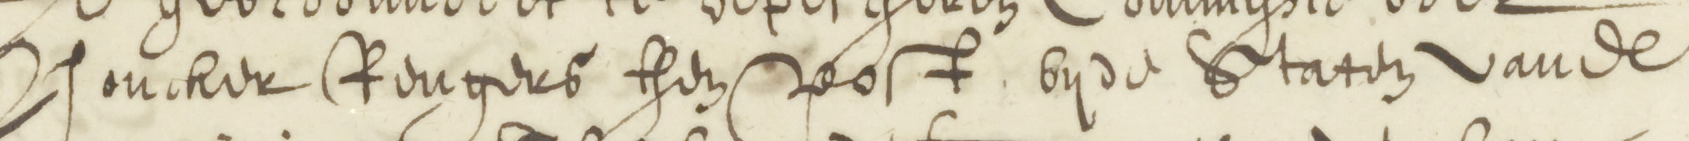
Joncker Rengers then Post by de Staten vande
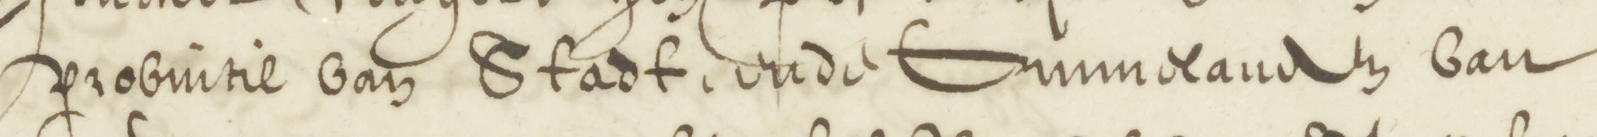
provintie van Stadt, ende Ommelanden van
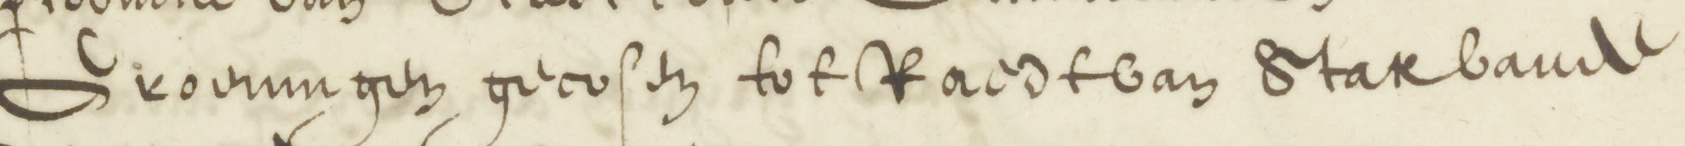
Groeningen gecosen tot Raedt van State vande
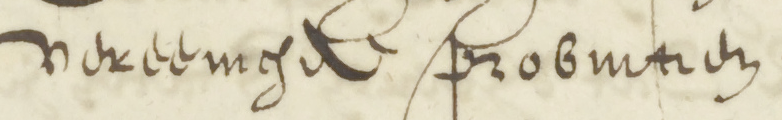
vereenichde provintien.
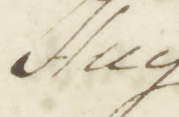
Huy
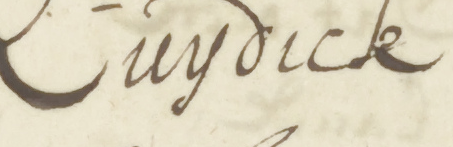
Luydick
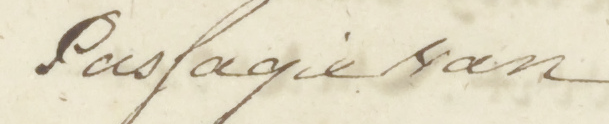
Passagie van
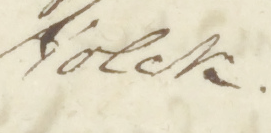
Volck.
